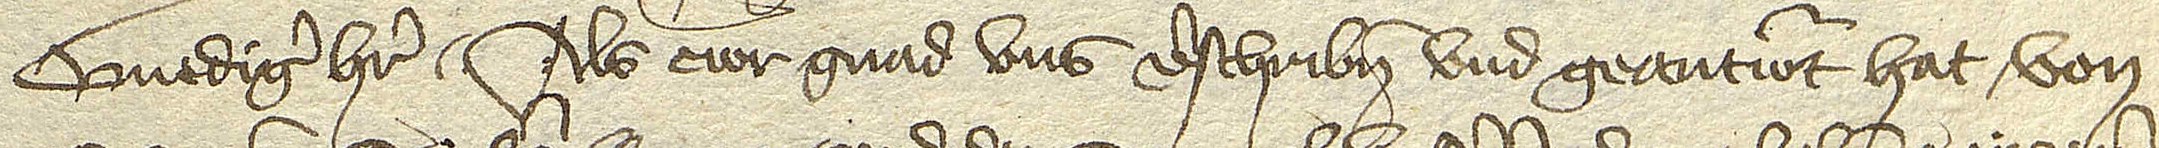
Gnedig* hr* / Als ewr gnad vns v*ſchribn* vnd geantwt* hat / von
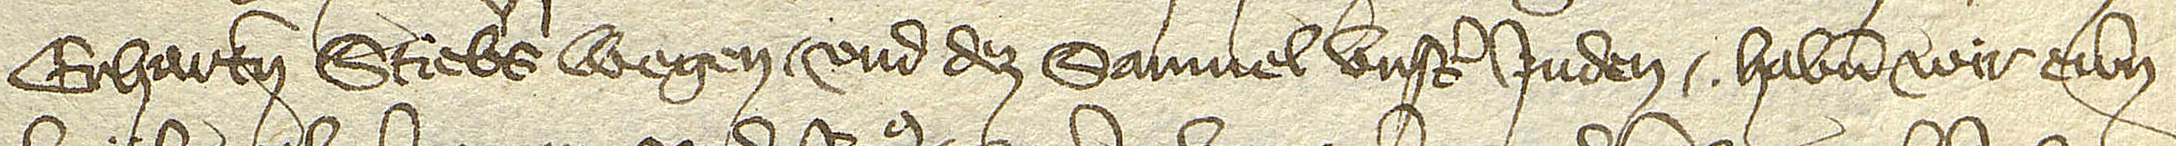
Erhartn* Stiebs* wegen / vnd deʒ Samuel vnſs* Iuden / . habn* wir ewn*
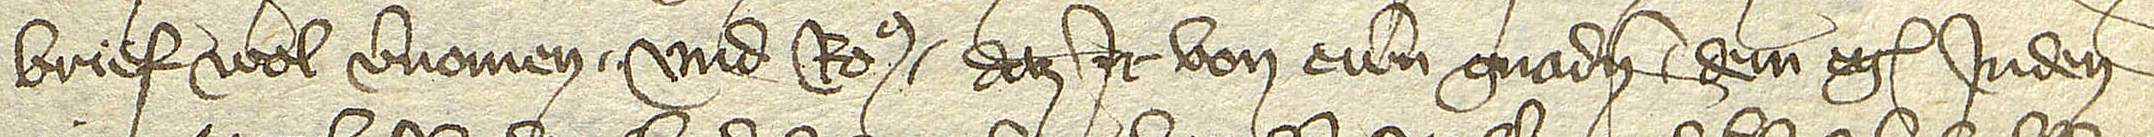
brief wol v*nomen / . vnd Ro* / daʒ Ir von ewn* gnadn* / dem eg* Iuden
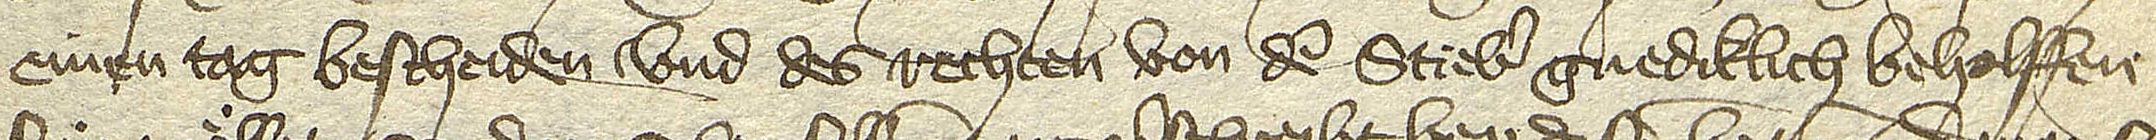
einen tag beſcheiden / vnd des rechten von d* Stieb* gnediklich beholffen
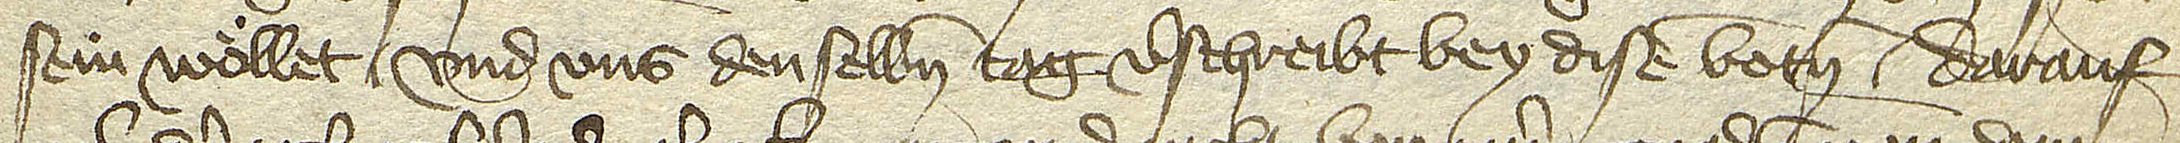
ſein wöllet / vnd vns denſelbn* tag v*ſchreibt bey diſe* botn* / darauf
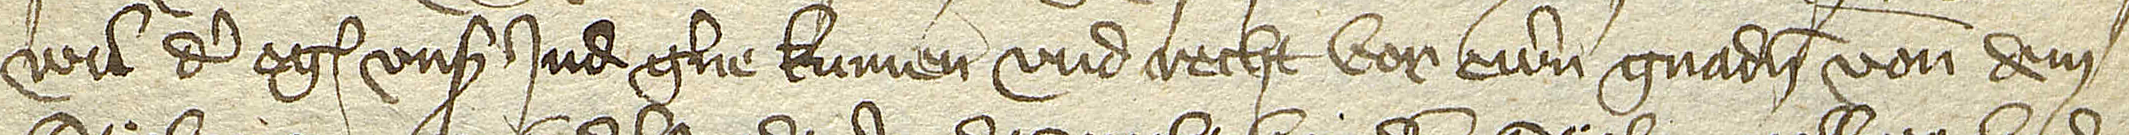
wil d* eg* vnſ* Iud g*ne kumen vnd recht vor ewn* gnadn* von dem
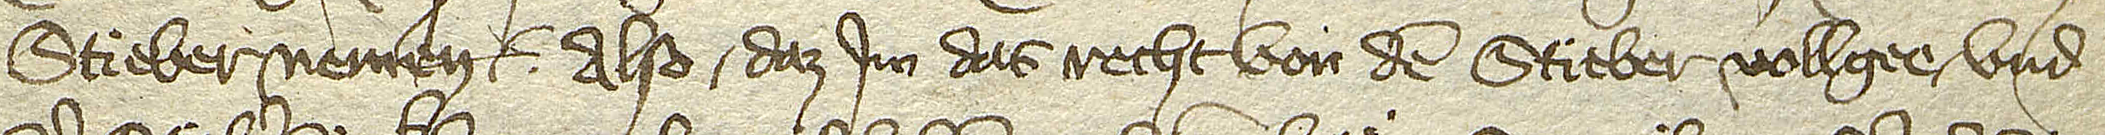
Stieber nemen / . Alſo / daʒ Im das recht von d* Stieber vollgee / vnd
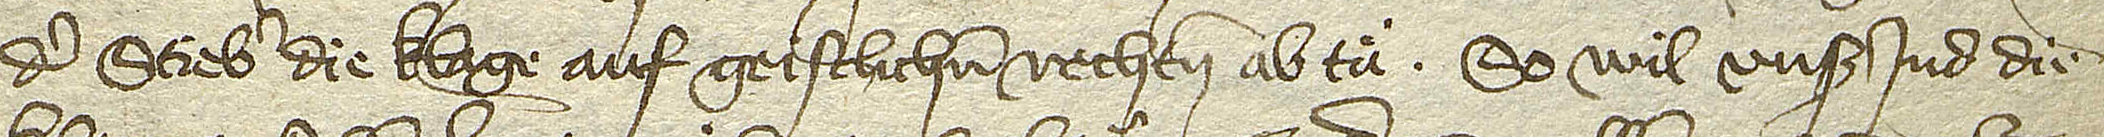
d* Stieb* die klage auf geiſtlichn* rechtn* ab tü . So wil vnſ* Iud die
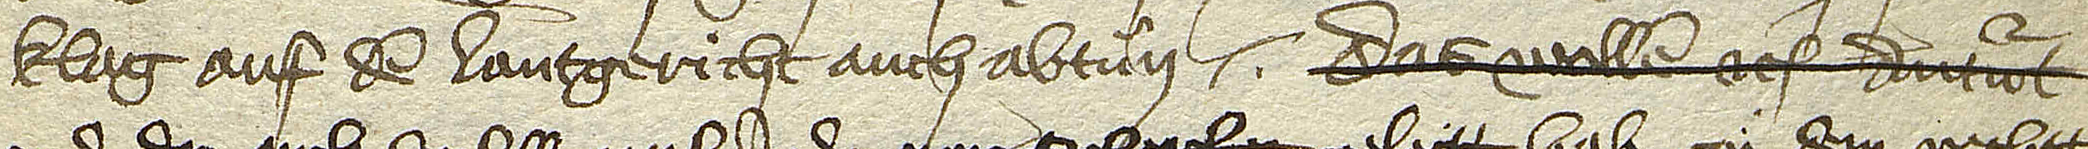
klag auf d* lantgericht auch abtün / . Das wolle* ec* Antw*t
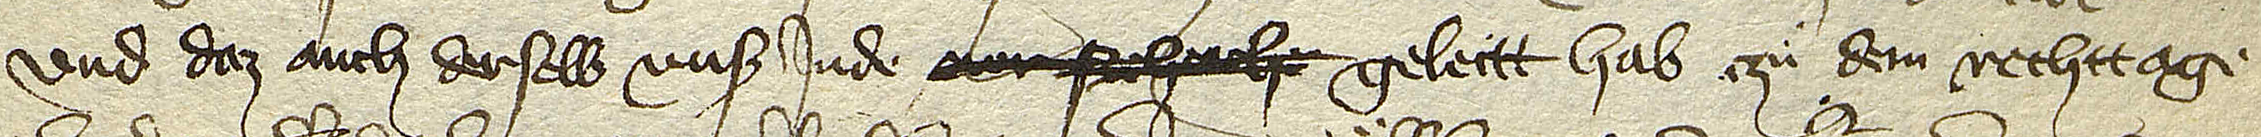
vnd daʒ auch derſelb vnſ* Iud ewr ſicherhe geleitt hab cʒü dem rechttage
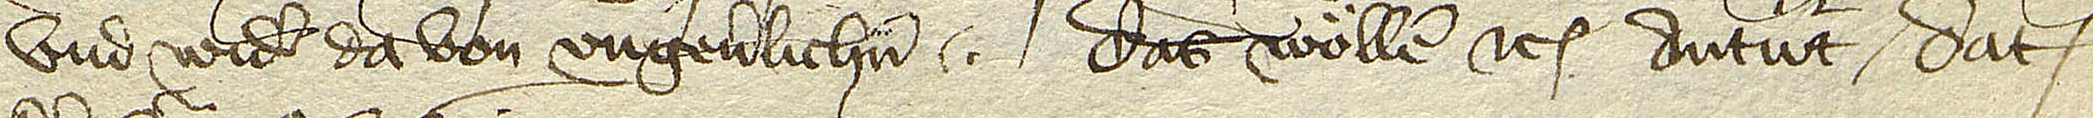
vnd wid* da von vngeu*lichn* / . Das wölle* ec* Antw*t / dat*
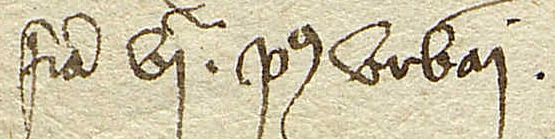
fia* vi* . p* vrbai* .
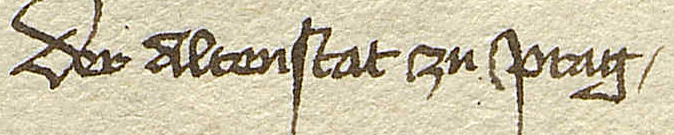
Der Altenſtat cʒu Prag /
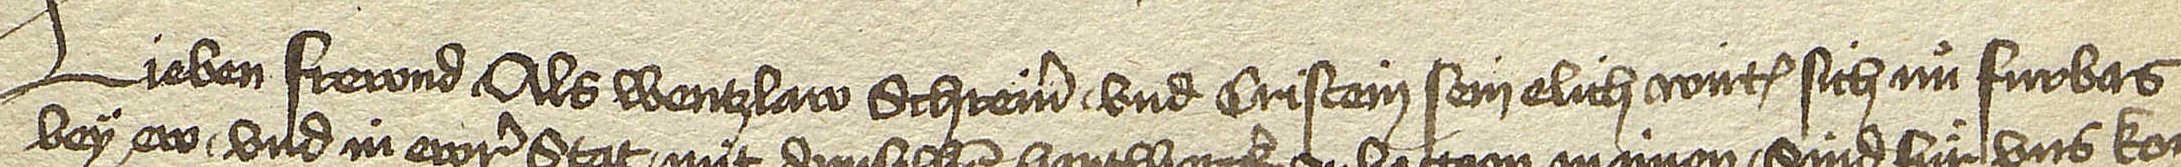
Lieben frewnd / Als wentʒlaw Schrein* / vnd Criſtein ſein elich wirt* ſich furbas
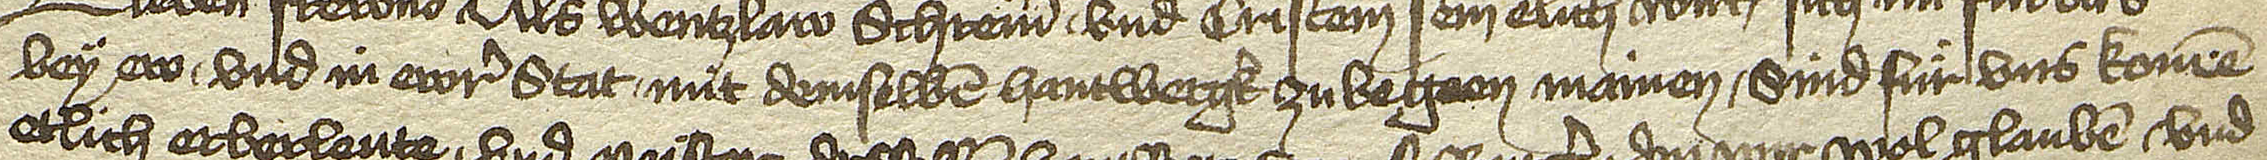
bey ew / vnd in ewr* Stat / mit demſelbe* hantwergk cʒu begeen mainen / Sind für vns kome*
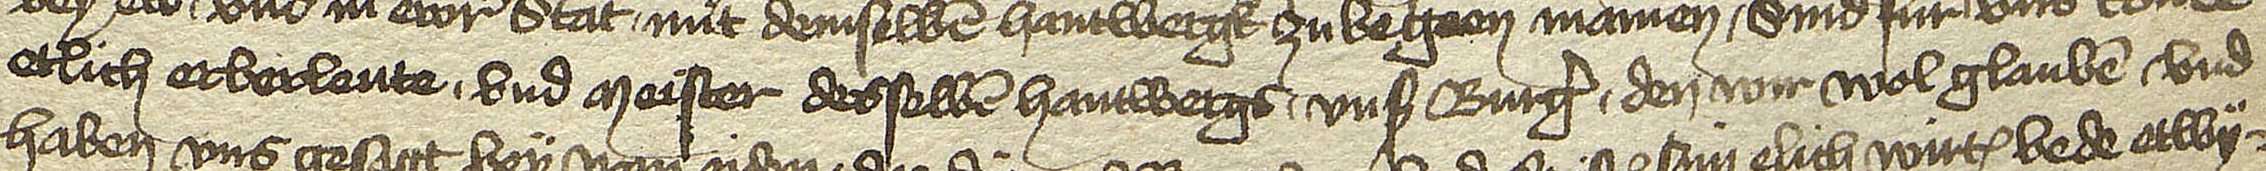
etlich erberleute / vnd Meiſter desſelbe* hantwergs / vnſ* Burg* / den wir wol glaube* / vnd
